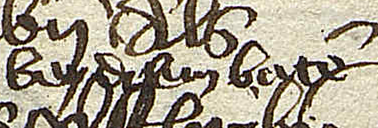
bey diſem bote*
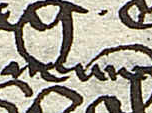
newe*
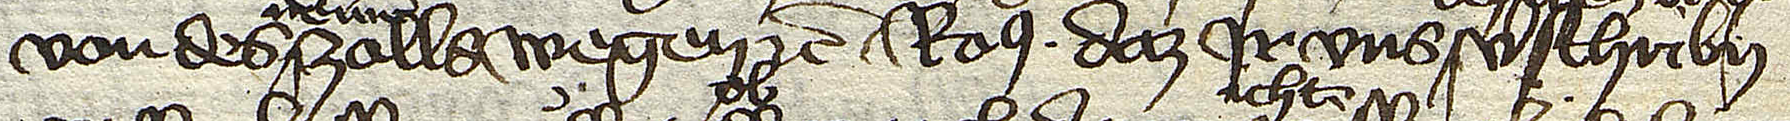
von des cʒolls wegen ec* Ro* . daʒ Ir vns v*ſchrib*n
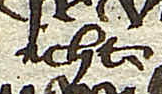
ichts
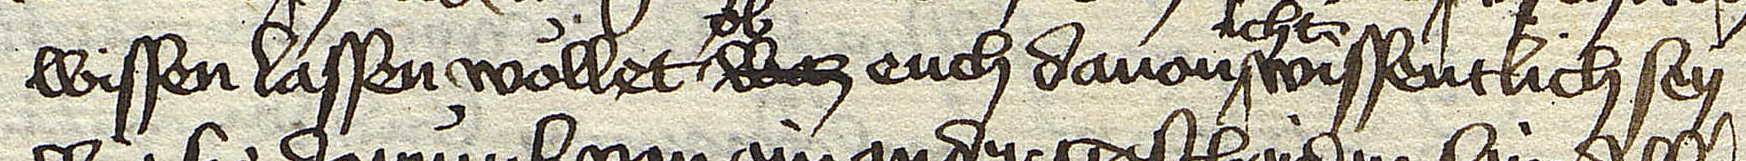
wiſſen laſſen wöllet / waʒ euch dauon wiſſentlich ſey
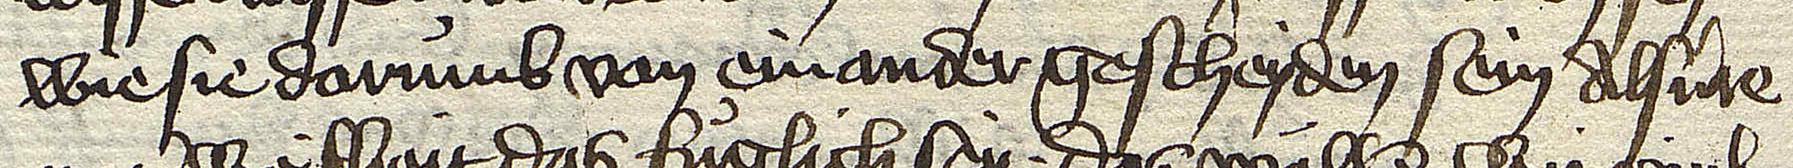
wie ſie darümb von einander geſcheyden ſein Alſu*re
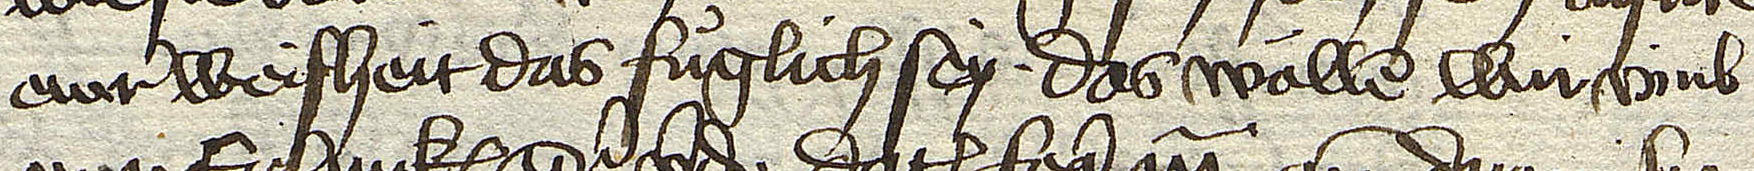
ewr* weiſheit das füglich ſey . das wölle* wir v̈mb
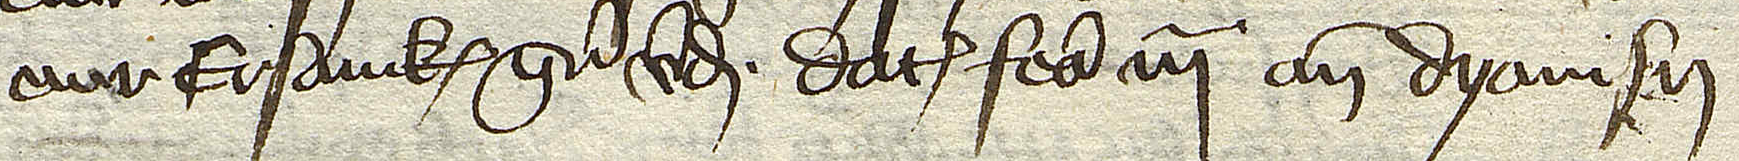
ewr Erſamk* gn* v*d* . dat fea* iii* an* dyoniſii
